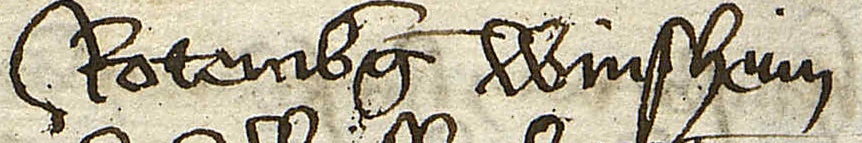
Rotemb*g Winſheim
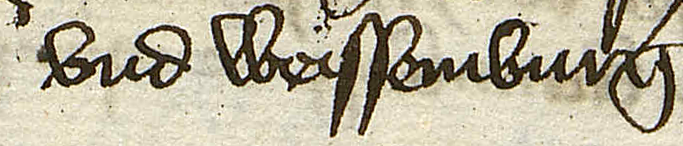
Vnd Weiſſemburg
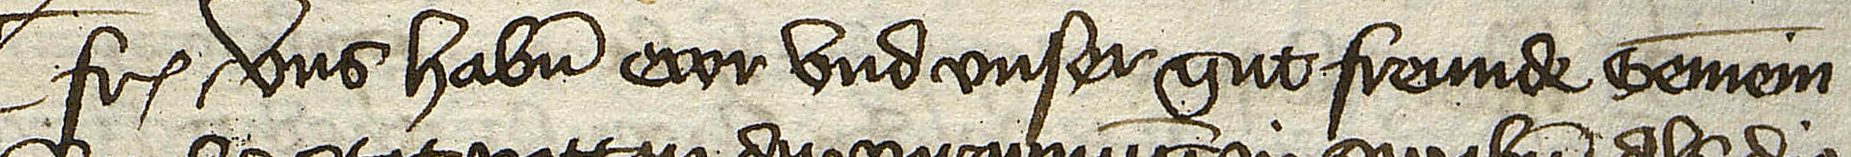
L* fr* / Vns hab*n ewr vnd vnſer gut freunde Gemein
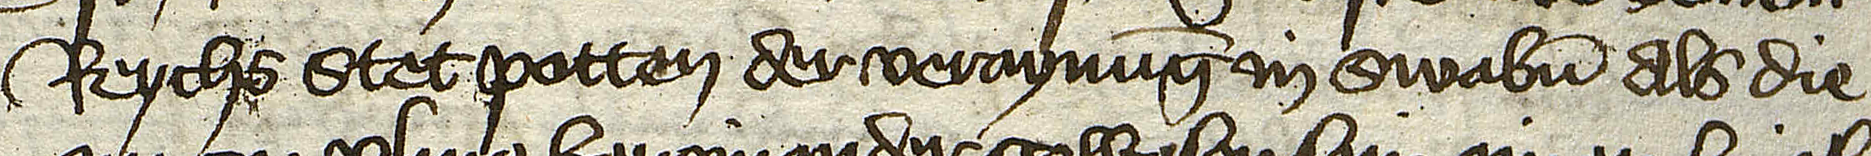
Reychs Stet potten der veraynu*g in Swab*n Als die
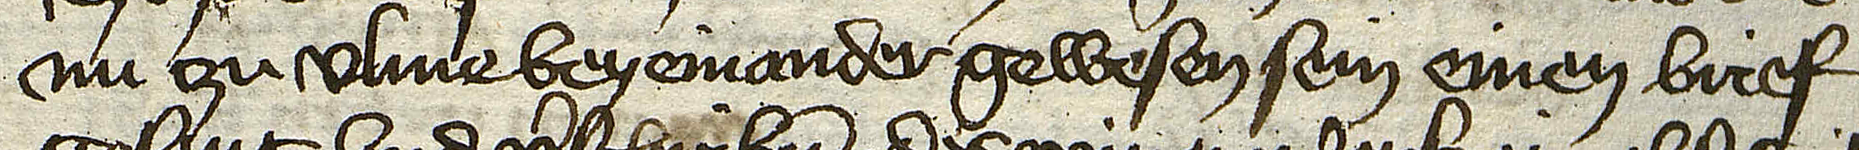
nu cʒu vlme beyeinander geweſen ſein einen brief
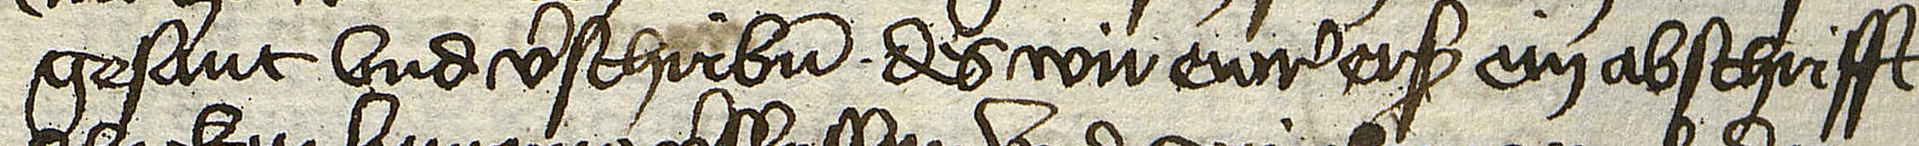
geſant Vnd v*ſchrib*n . des wir ewr* erſ* ein abſchrifft
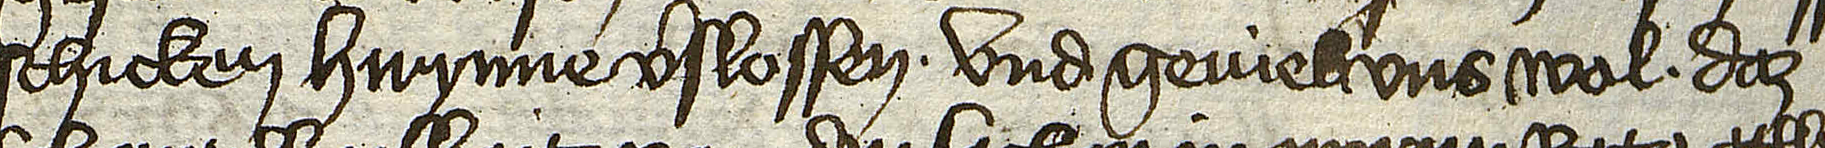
ſchicken hirynne v*ſloſſen . Vnd geuiel vns wol . daʒ
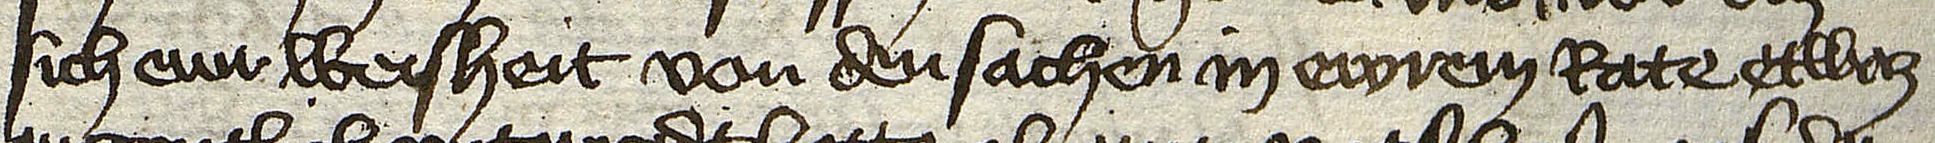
ſich ewr weiſheit von den ſachen in ewrem Rate etwaʒ
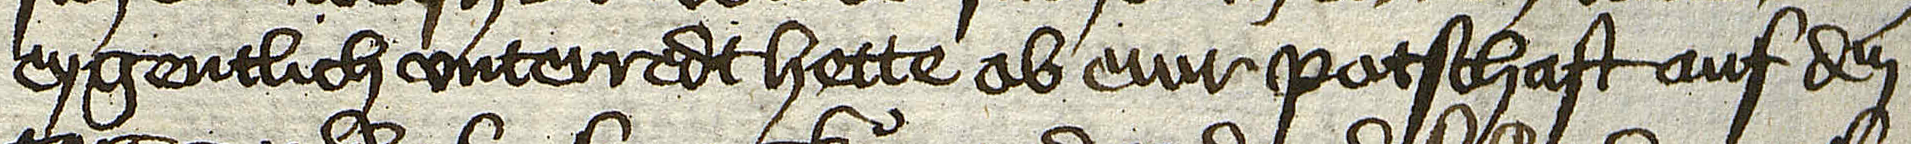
eygentlich vnterredt hette ob ewr potſchaft auf den
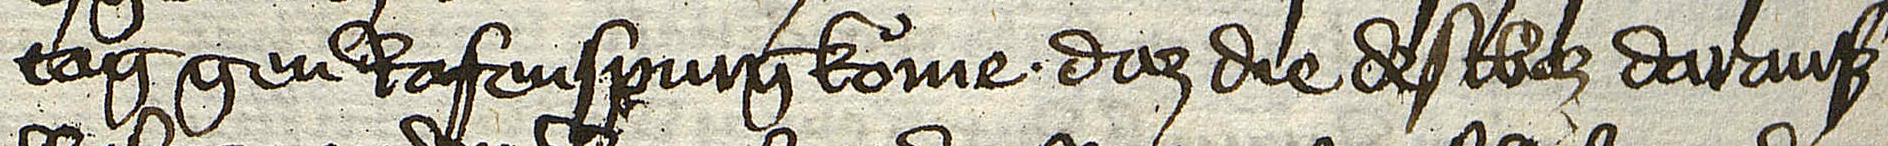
tag gen Rafenſpurg köme . daʒ die deſtbaʒ darauſʒ
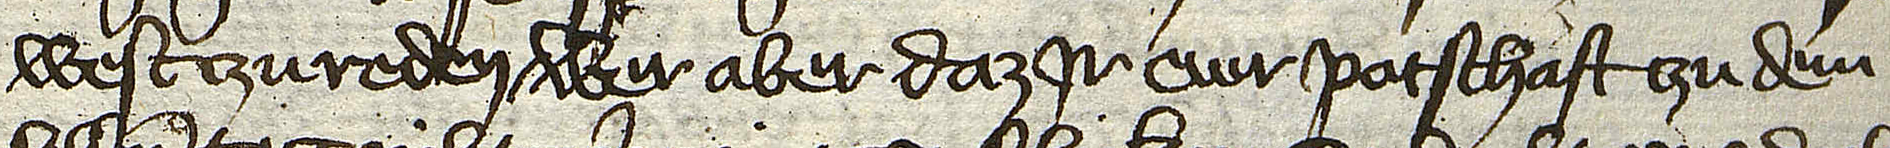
weʒt cʒu reden / Wer aber daʒ Ir ewr potſchaft cʒu dem
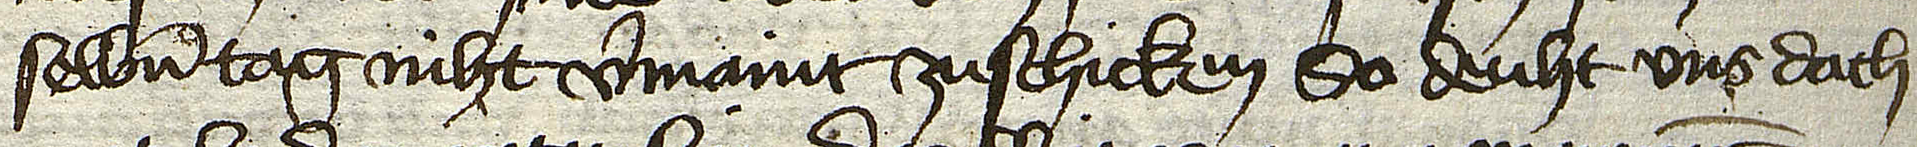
ſelb*n tag niht v*maint cʒu ſchicken So deuht vns doch
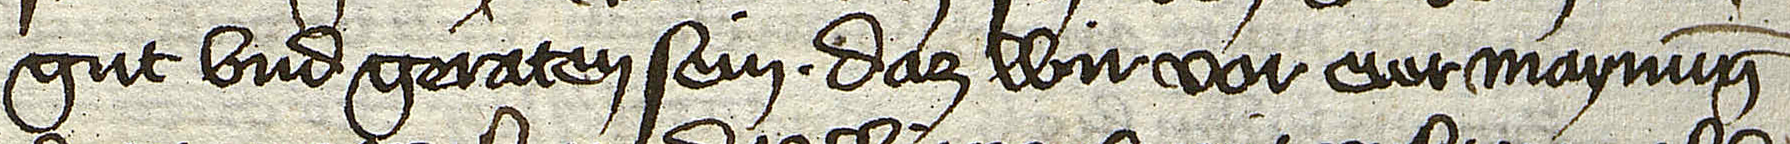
gut vnd geraten ſein. daʒ wir von ewr maynu*g
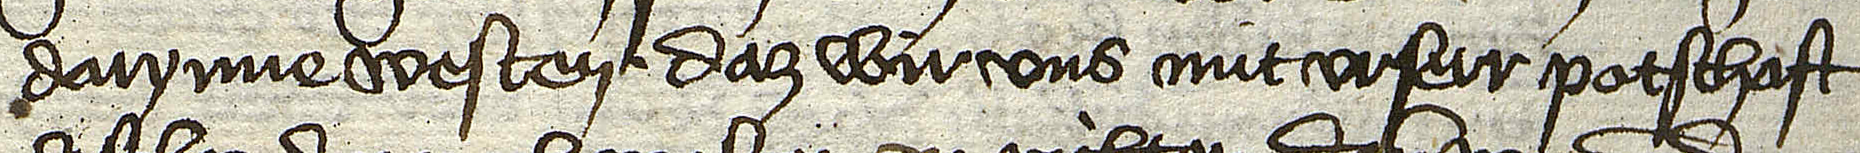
darynne weſten . daʒ wir vns mit vnſerr potſchaft
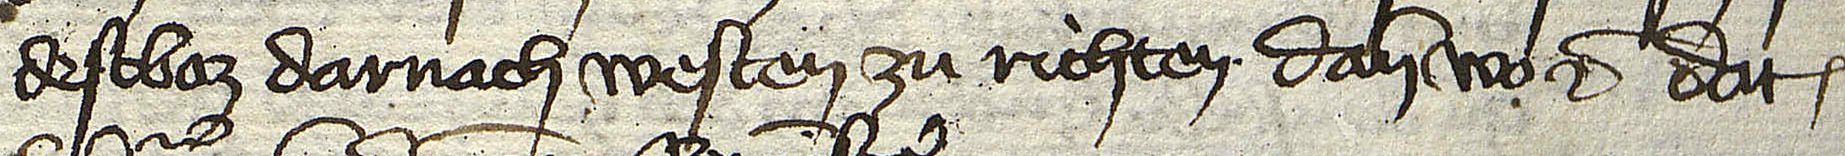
deſtbaʒ darnach weſten ʒu richten . dan* wo ec* Dat*
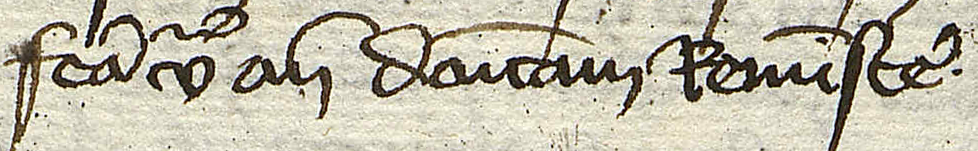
fe*a v* an* doicam* Remiſce*
